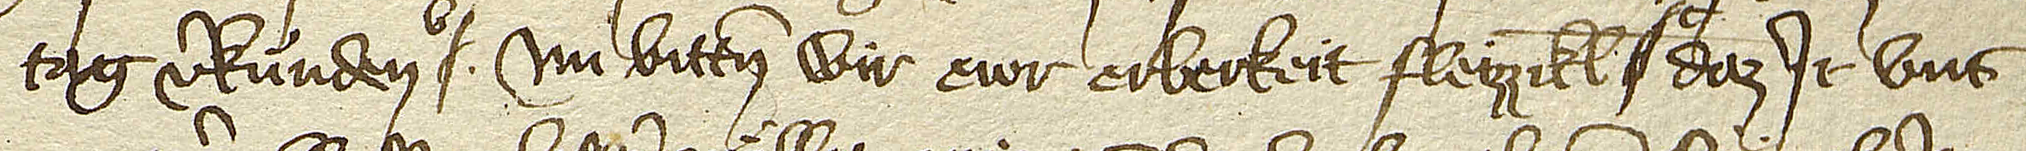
tag v*künden / . Nu bittn* wir ewr erberkeit fleiʒʒikl* daʒ Ir vns
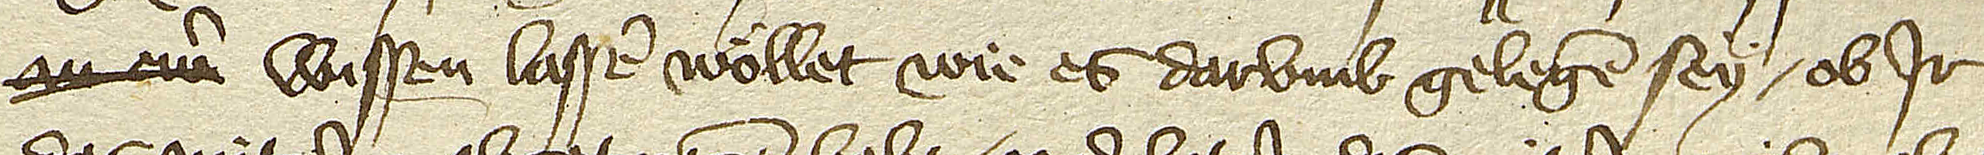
an ew* wiſſen laſſe* wöllet wie es darvmb gelege* ſey / ob Ir
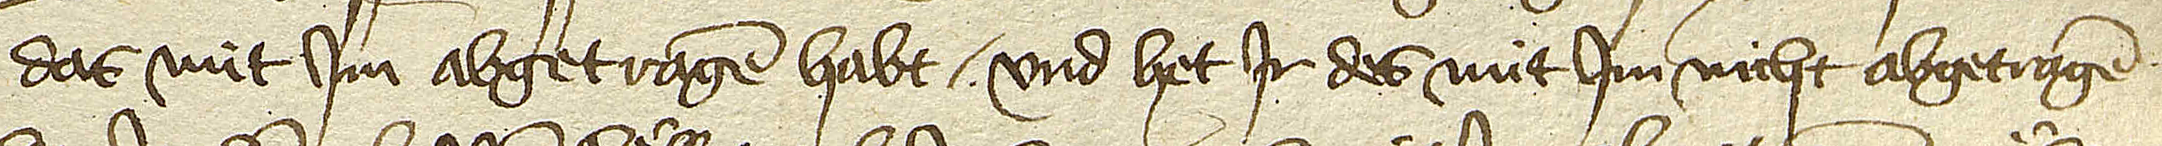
das mit Im abgetrage* habt / . vnd het Ir des mit Im nicht abgetrage*
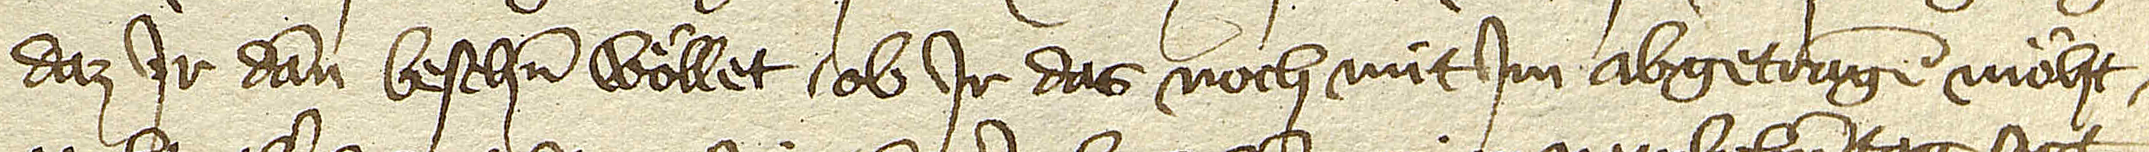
daʒ Ir beſehn* wöllet / ob Ir das noch mit Im abgetrage* möht /
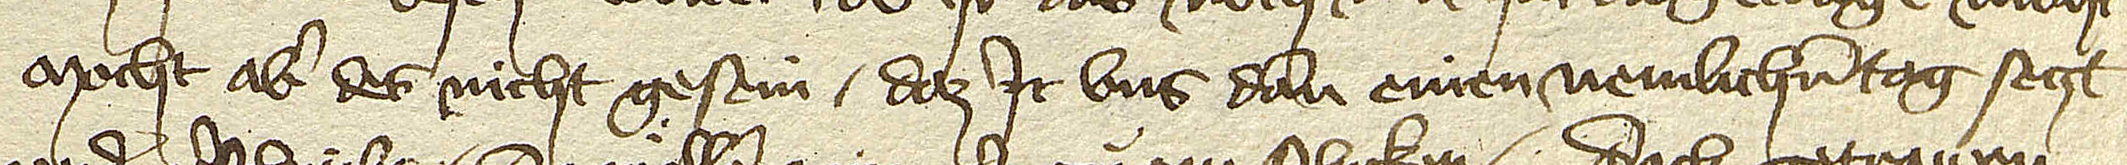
Mocht ab* des nicht geſein / daʒ Ir vns dan* einen nemlichn* tag ſecʒt
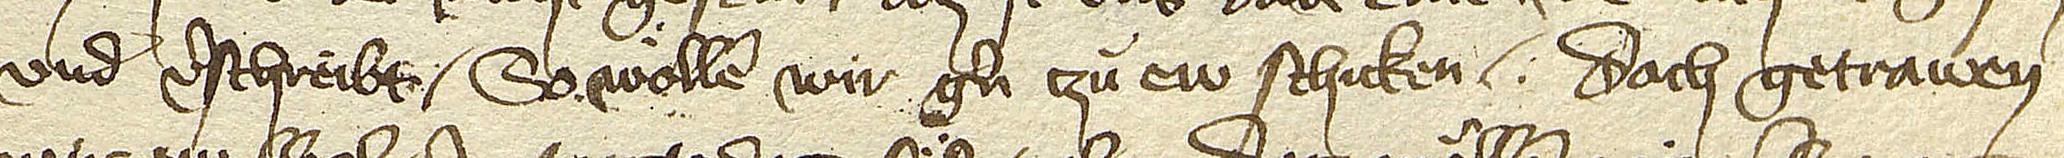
vnd v*ſchreibt / So wölle* wir g*n cʒü ew ſchicken / . Doch getrawen
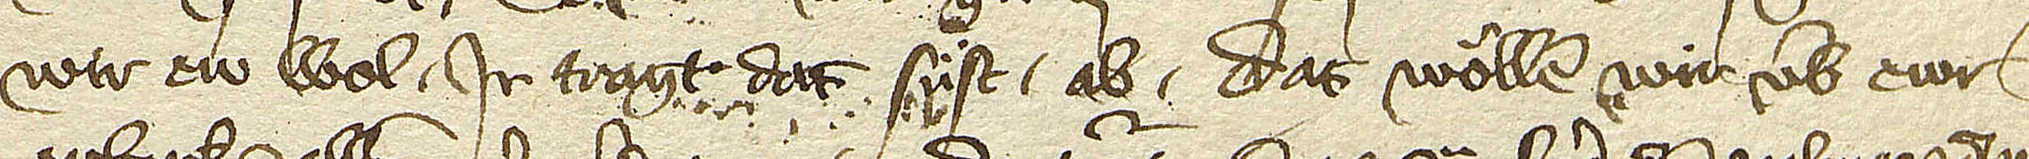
wir ew wol / Ir tragt das ſüſt / ab / Das wölle* wir v*b ewr
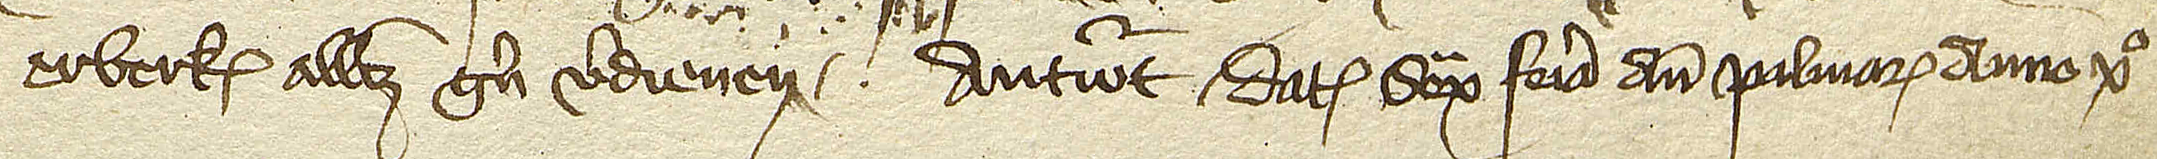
erberk* allcʒ* g*n v*dienen / . Antwt* / Dat* Sex* feia* An* palma* Anno x*
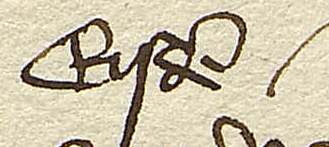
Eiſd* /
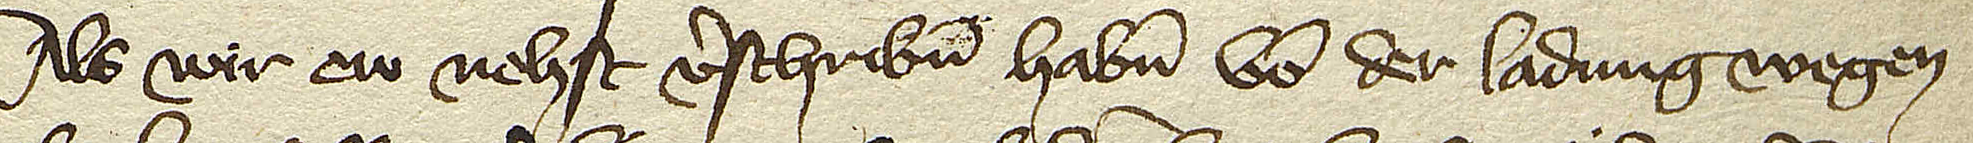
Als wir ew nehſt v*ſchribn* habn* vo* der ladung wegen
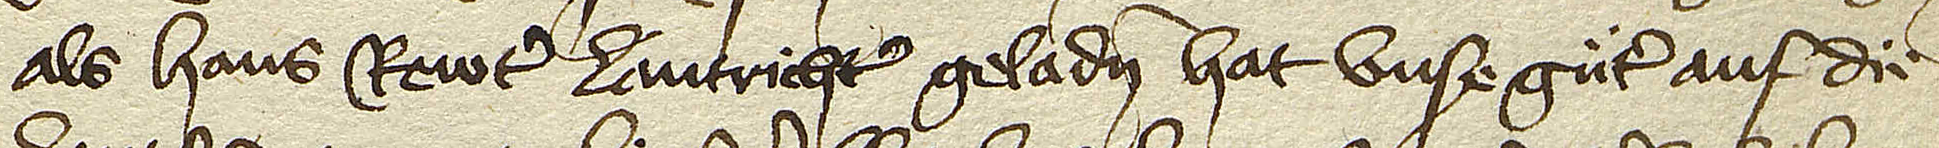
als hans Rewt* Lantricht* geladn* hat vnſ*e güt* auf die
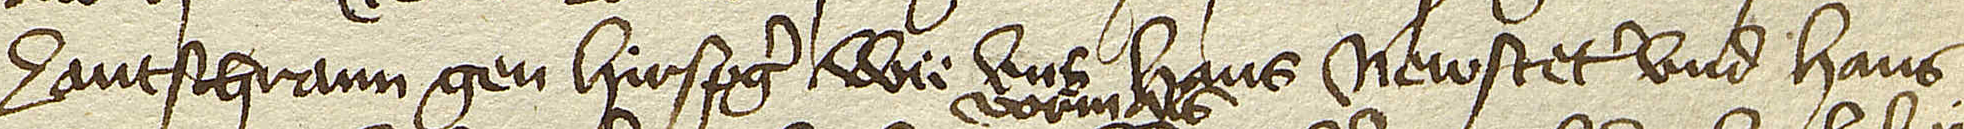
Lantſchrann gen hirſpg* / wie vns hans Newstet* vnd hans
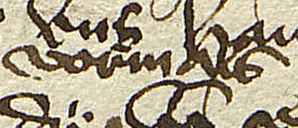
vormals
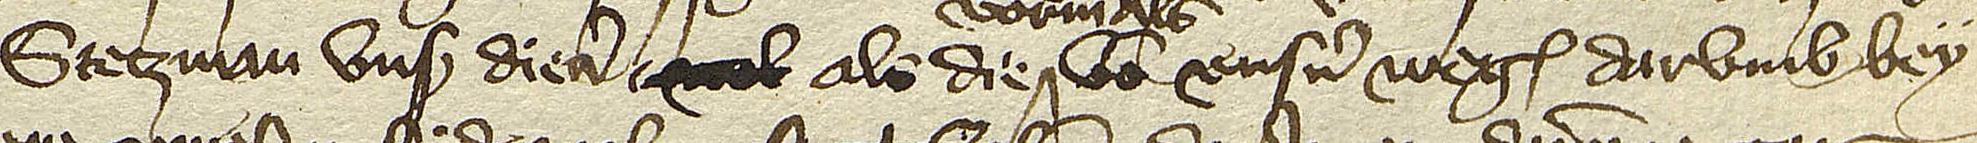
Stecʒman vnſ* dien* / wol als die vo* vnſn* weg* darvmb bey
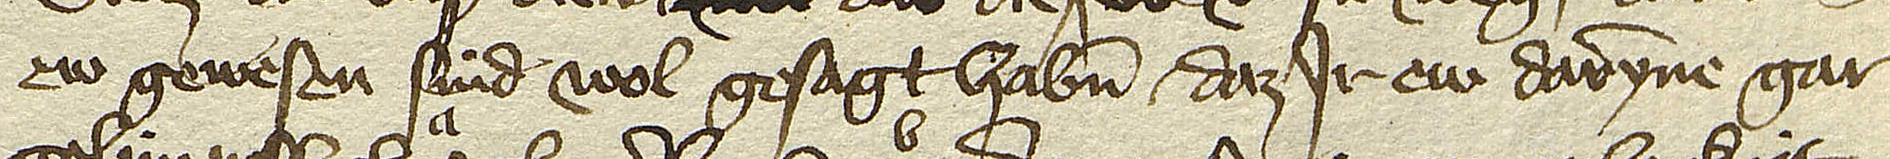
ew geweſen ſind wol geſagt habn* / daʒ Ir ew dar*yne gar
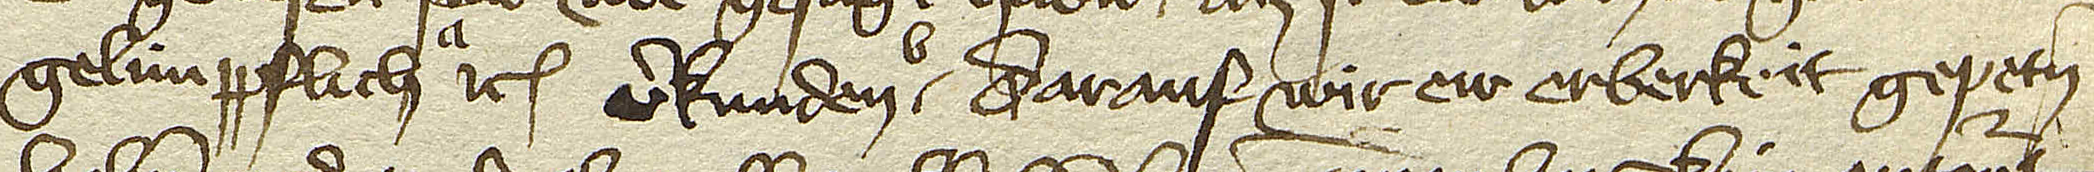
gelimppflich ec* v*kunden / darauf wir ew erberkeit gepetn*
